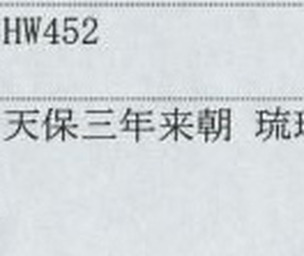天保三年來朝
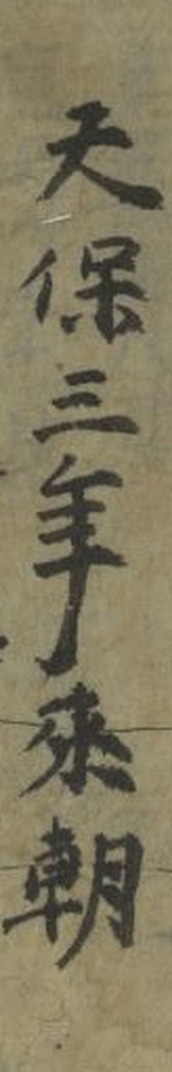天保三年來朝
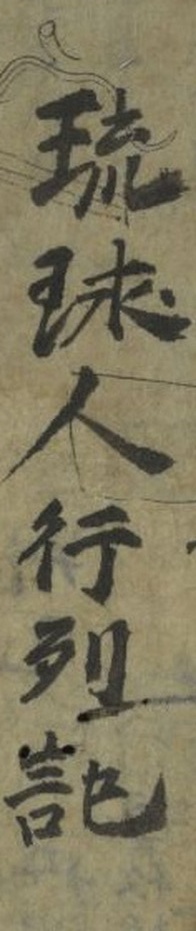琉球人行列記

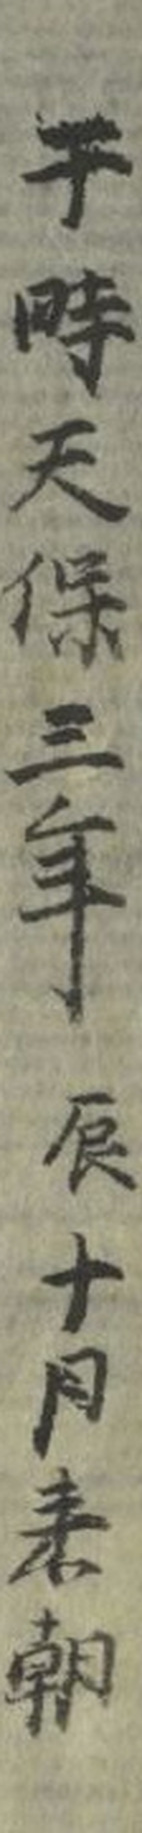于時天保三年辰十月来朝
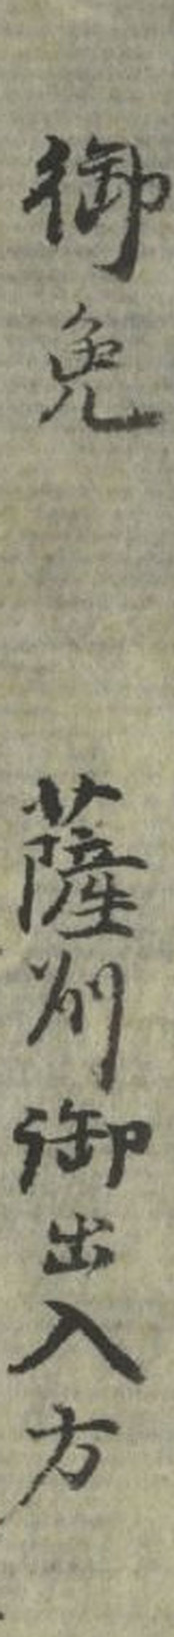御免薩州御出入方
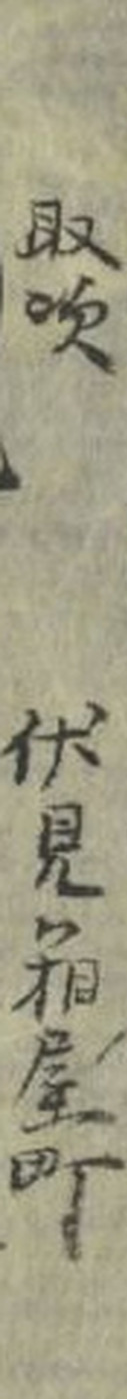取次伏見箱屋町
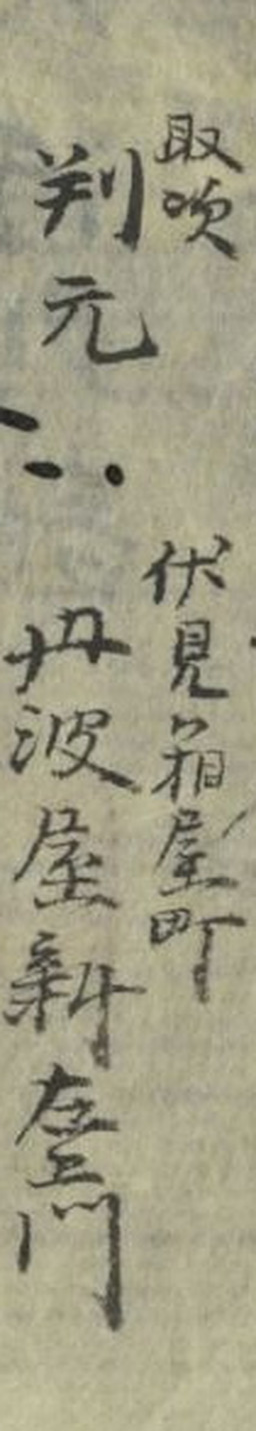判元丹波屋新左ヱ門
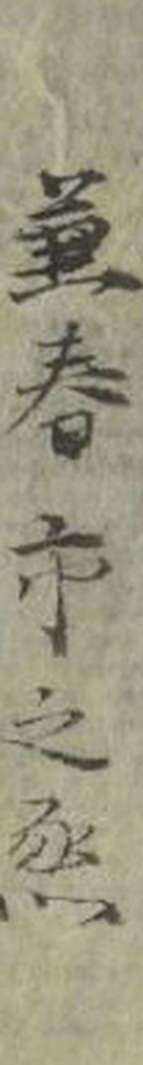兼春市之焏
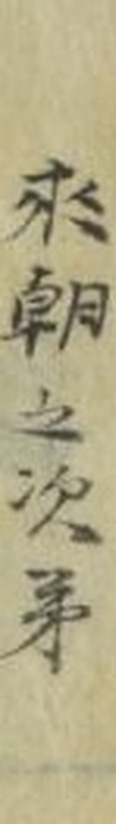來朝之次第
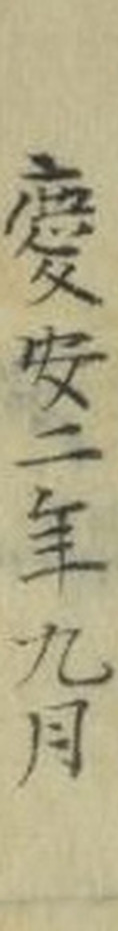慶安二年九月
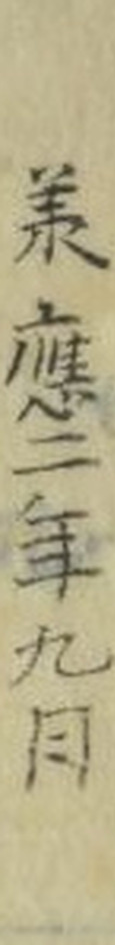承應二年九月
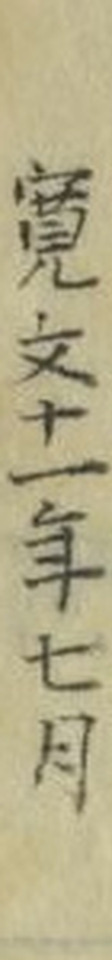寛文十一年七月
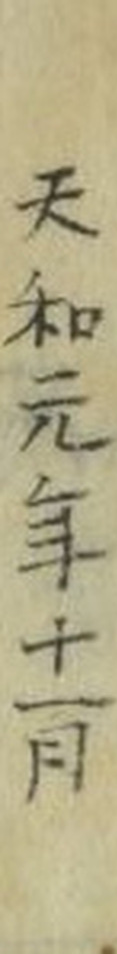天和元年十一月
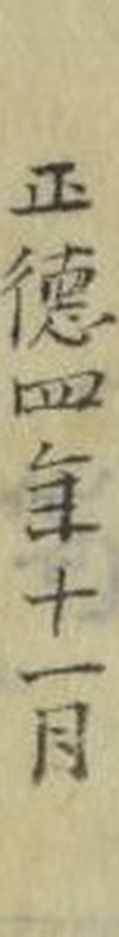正德四年十一月
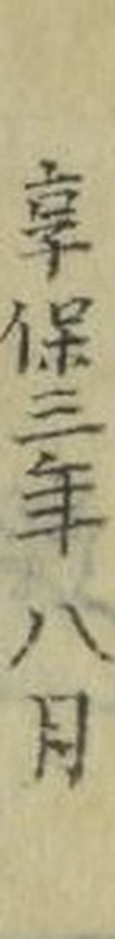享保三年八月
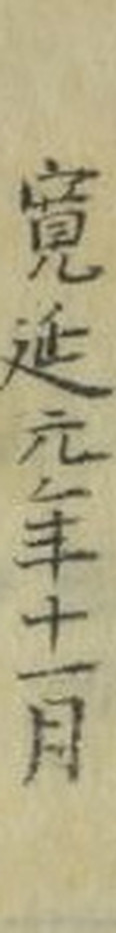寛延元年十一月
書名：天保三年来朝 琉球人行列記
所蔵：University of the Ryukyus Library
